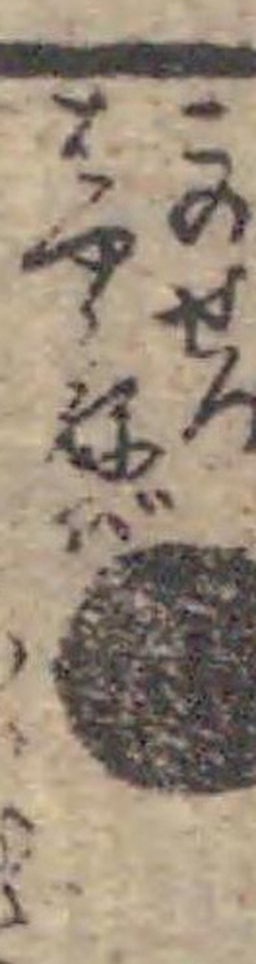はやらねば
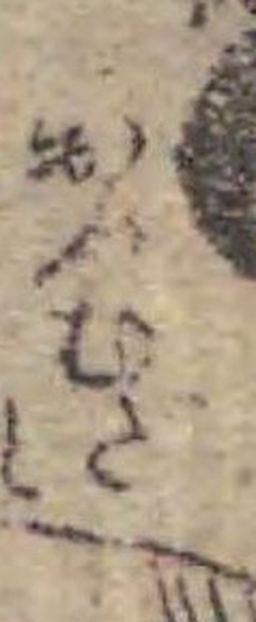おふむたと
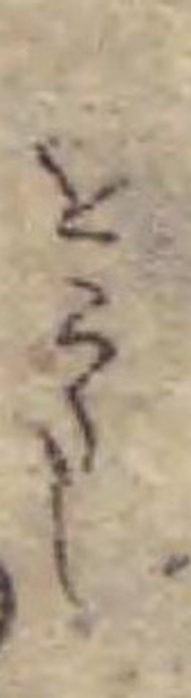をこらし
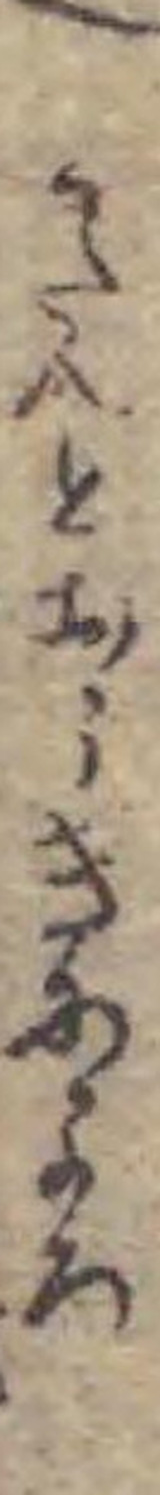うたんとおうきによろ
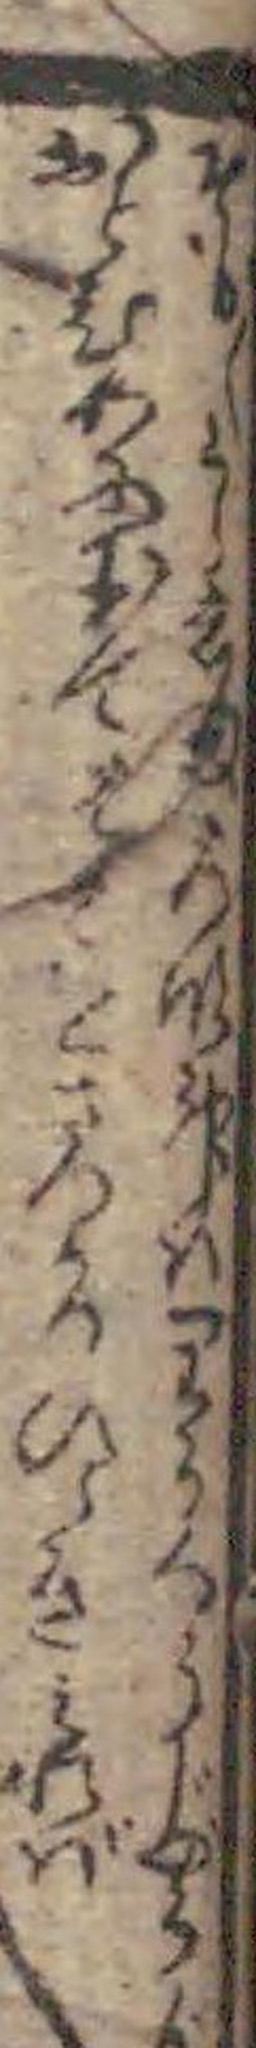おとひめに玉てはこをさつかりひらきみれば
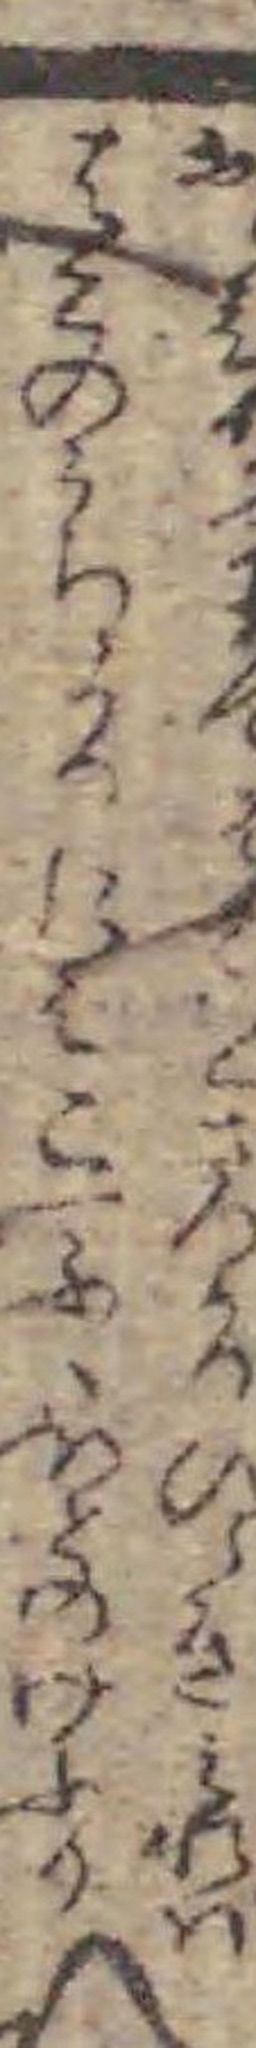はこのうちよりたはこ一ふくほとのけふり
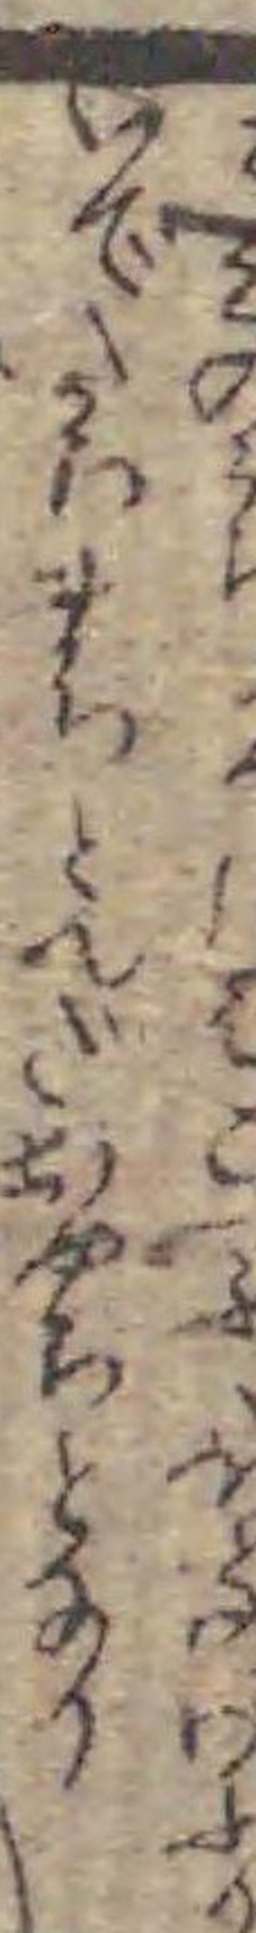いでたちまちとんだおやちとなり
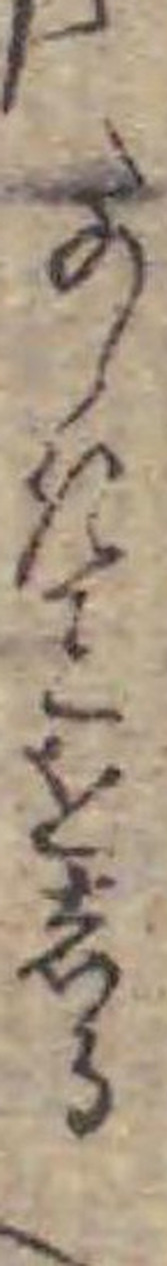たのしきことをしる
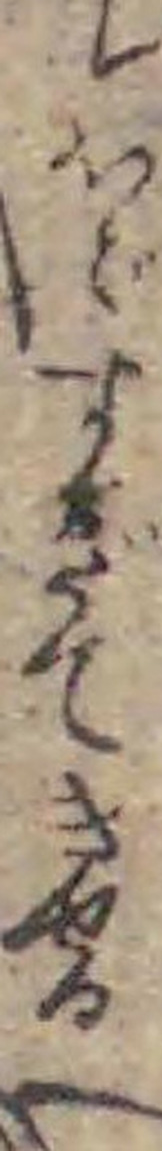ほどすぎてきせる
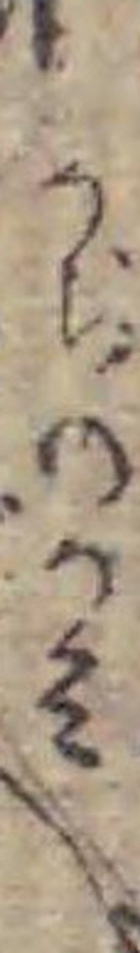かぢのかみ
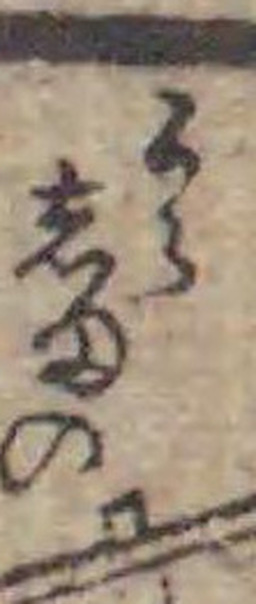しまの
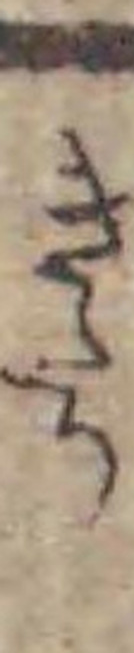きたり
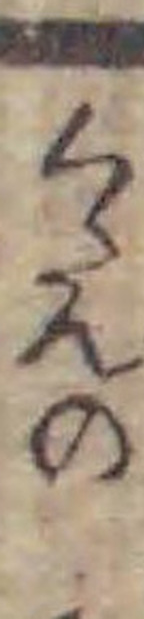くたんの
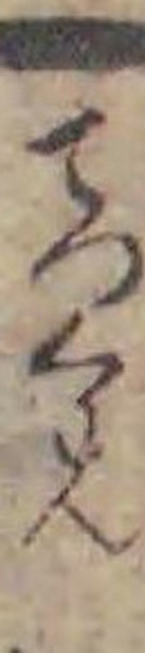てつくわん
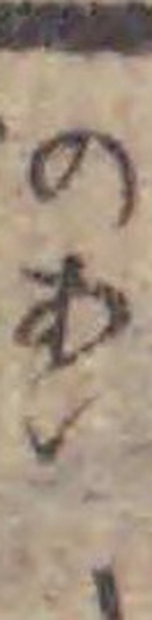のあい
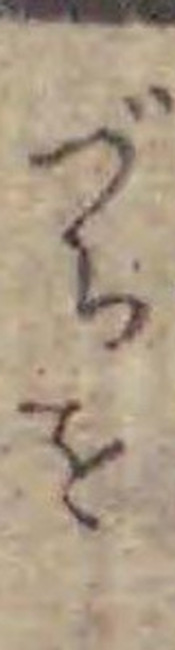づちを
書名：威気千代牟物語 : 2巻
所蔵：国立国会図書館 National Diet Library, JAPAN
